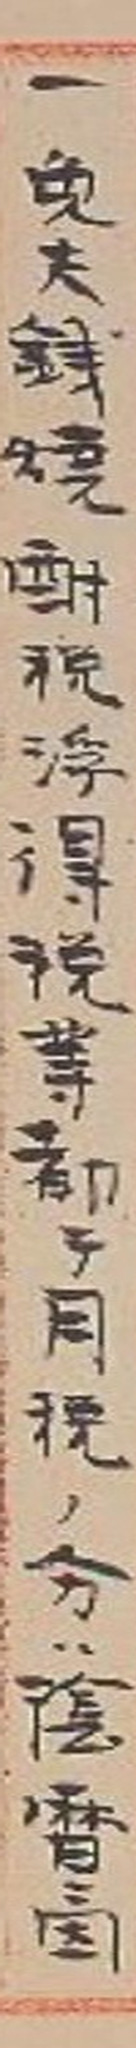一免夫銭焼酎税浮得税等都テ月税ノ分ハ陰暦ニ因
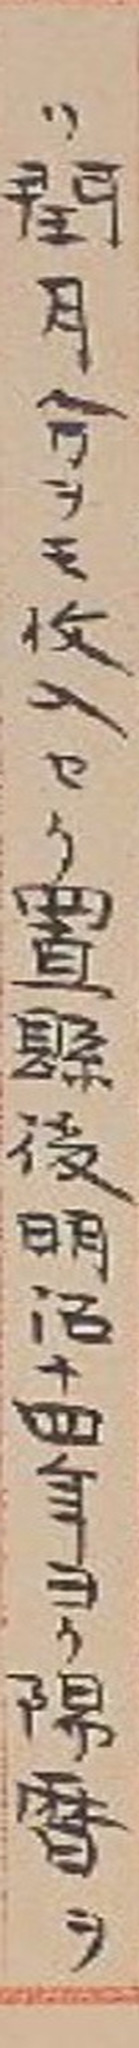リ閏月分ヲモ収入セリ置県後明治十四年ヨリ陽暦ヲ
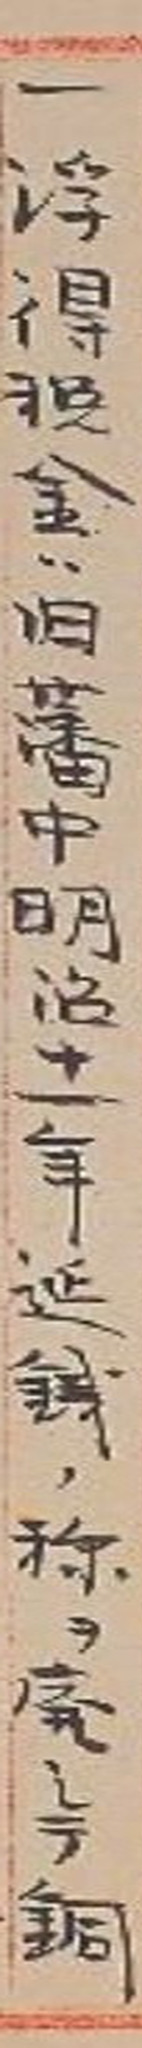一浮得税金ハ旧藩中明治十一年延銭ノ称ヲ廃シテ銅
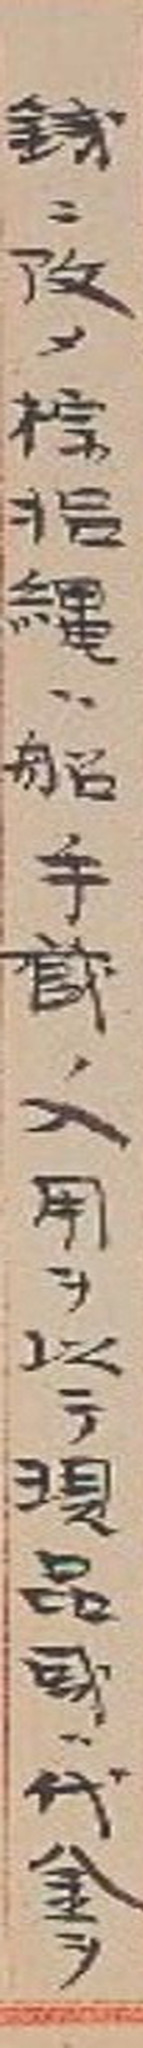銭ニ改メ棕梠縄ハ船手蔵ノ入用ヲ以テ現品或ハ代金ヲ
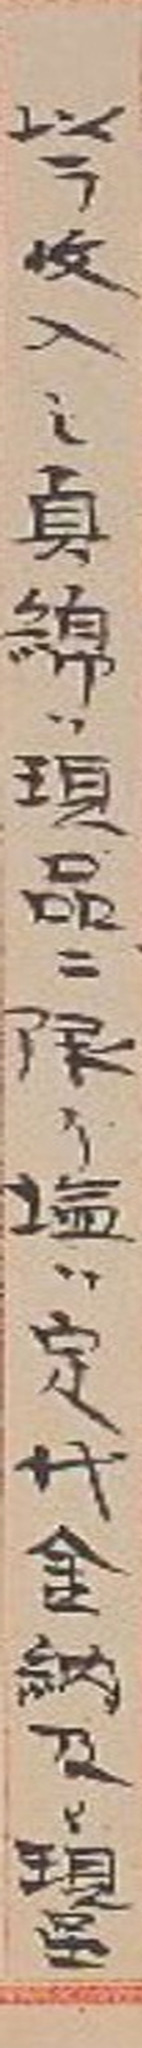以テ収入シ真綿ハ現品ニ限リ塩ハ定代金納及ヒ現品
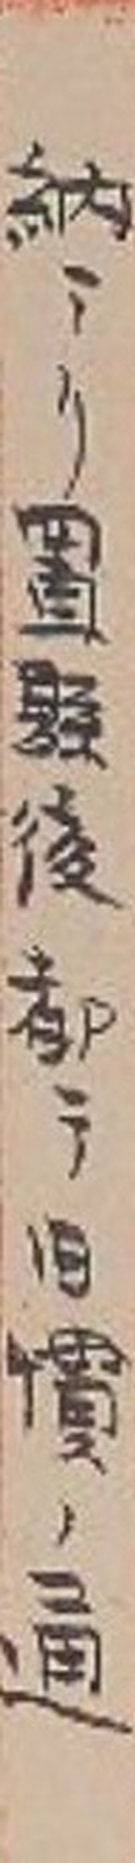納アリ置県後都テ旧慣ノ通
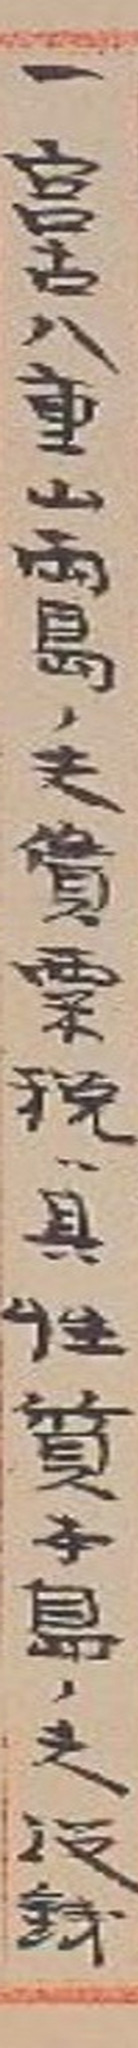一宮古八重山両島ノ夫賃粟税ハ其性質本島ノ夫役銭
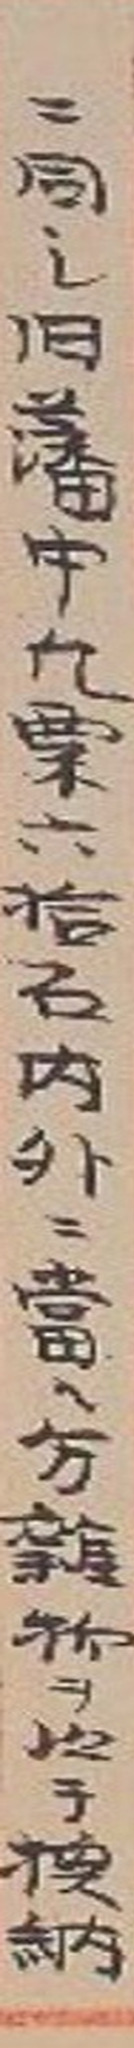ニ同シ旧藩中凡粟六拾石内外ニ当ル分雑物ヲ以テ換納
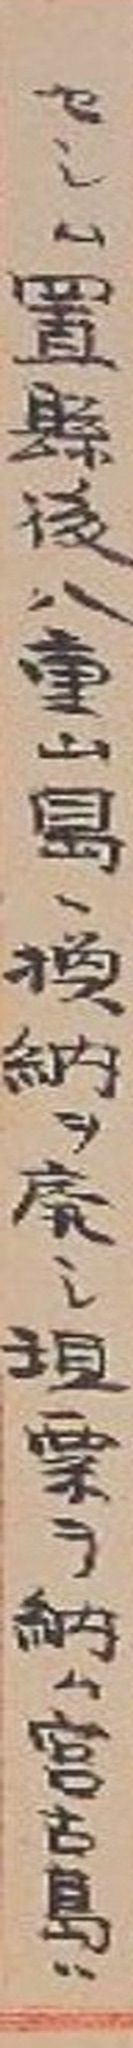セシム置県後八重山島ハ換納ヲ廃シ現粟ヲ納ム宮古島ハ

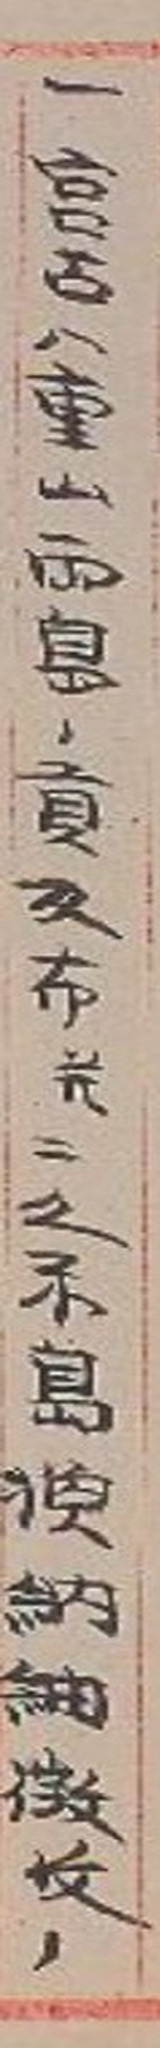一宮古八重山両島ノ貢反布并ニ久米島換納紬徴収ノ
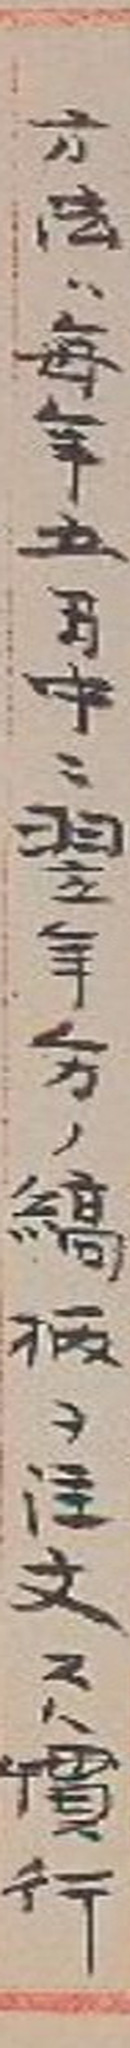方法ハ毎年五月中ニ翌年分ノ縞柄ヲ注文スル慣行
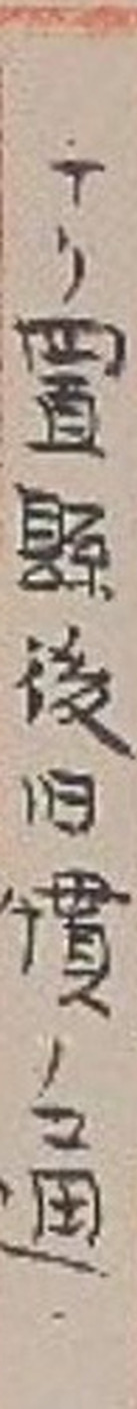ナリ置県後旧慣ノ通
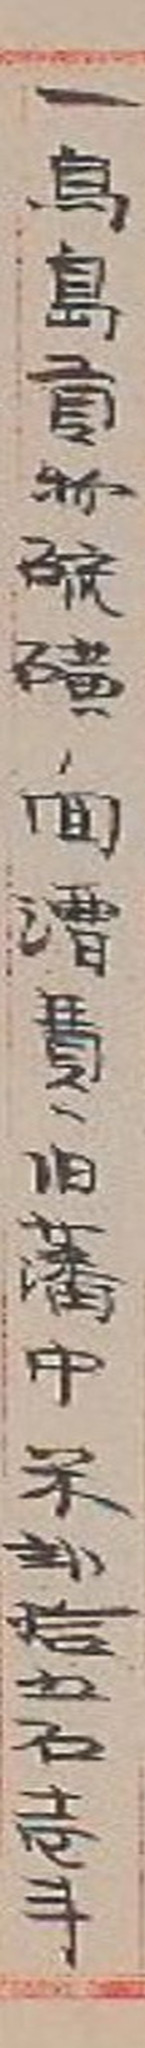一鳥島貢物硫磺ノ回漕費ハ旧藩中米弐拾五石壱斗
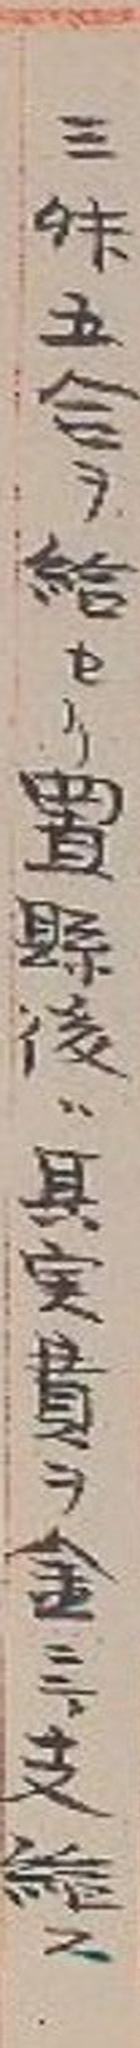三升五合ヲ給セリ置県後ハ其実費ヲ金ニテ支給ス
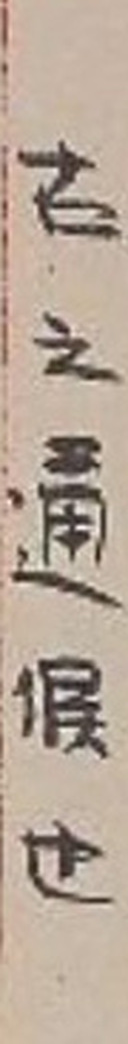右之通候也
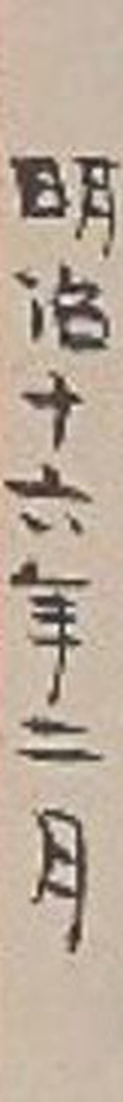明治十六年二月
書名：貢納物品領収旧藩慣例並ニ置県後取扱順序
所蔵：University of the Ryukyus Library
